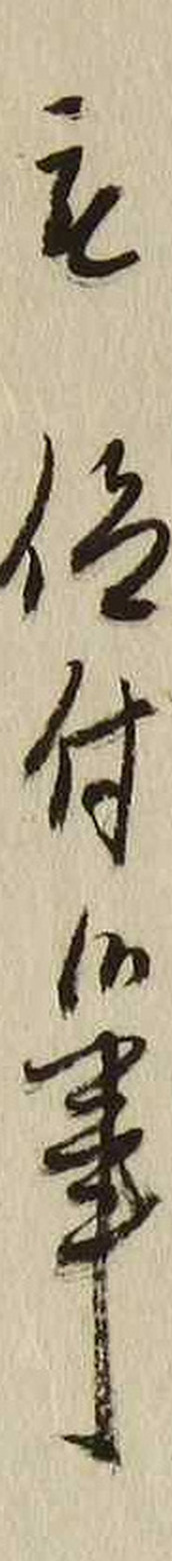被仰付候事
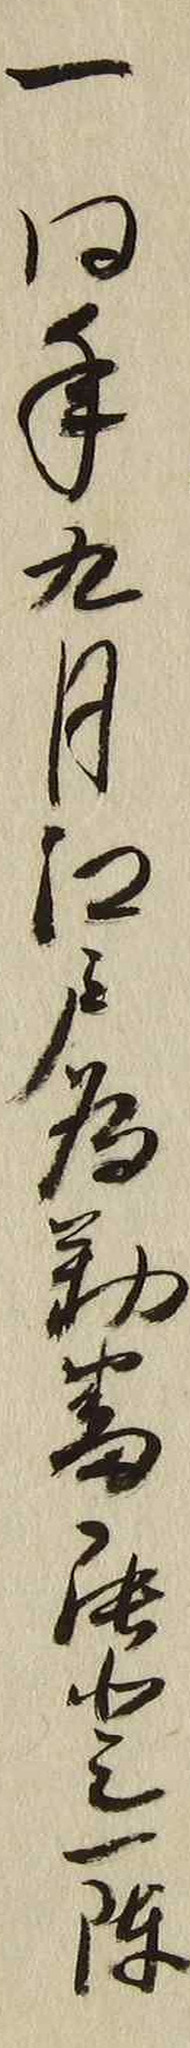一同年九月江戸為勤番罷登一陣
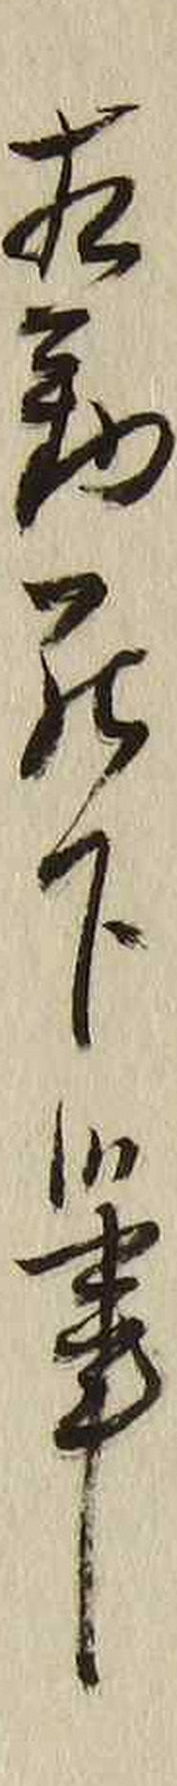相勤罷下候事
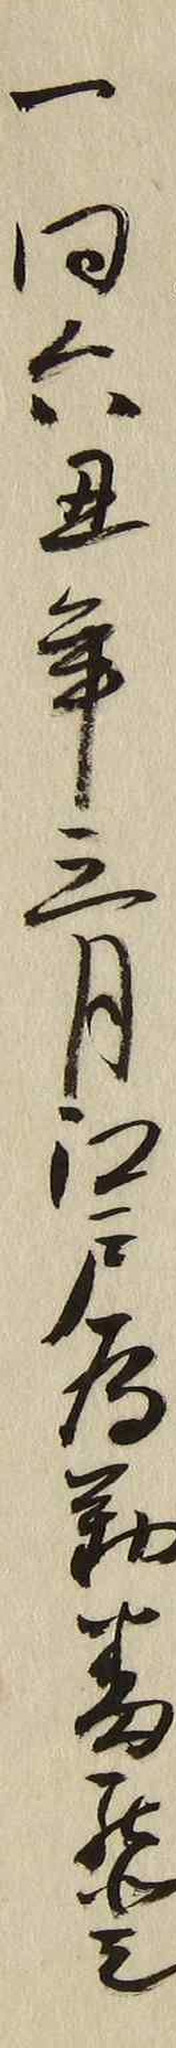一同六丑年三月江戸為勤番罷登
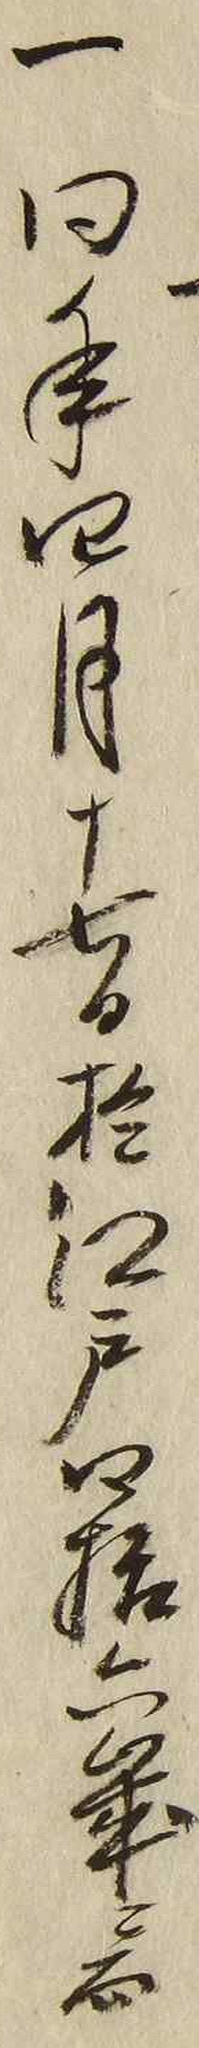一同年四月十七日於江戸四拾六歳ニ而

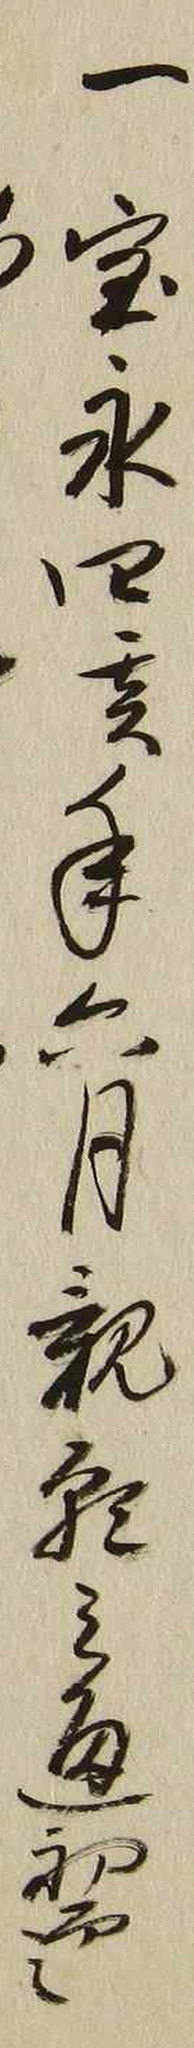一宝永四亥年六月親願之通初而之
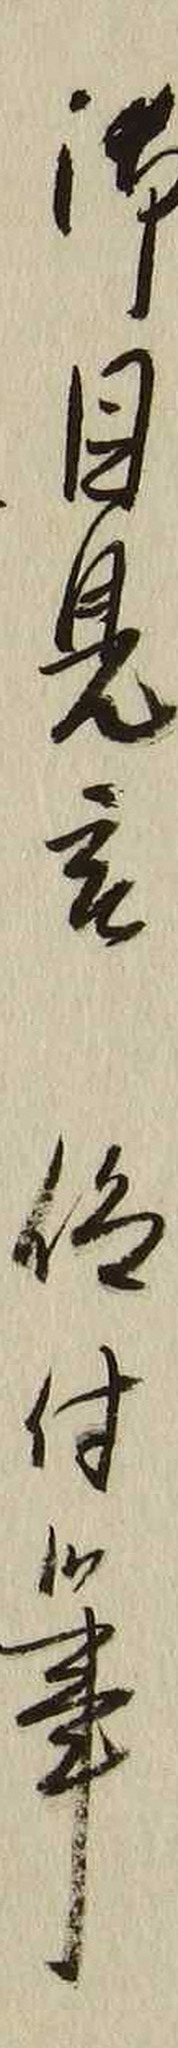御目見被仰付候事
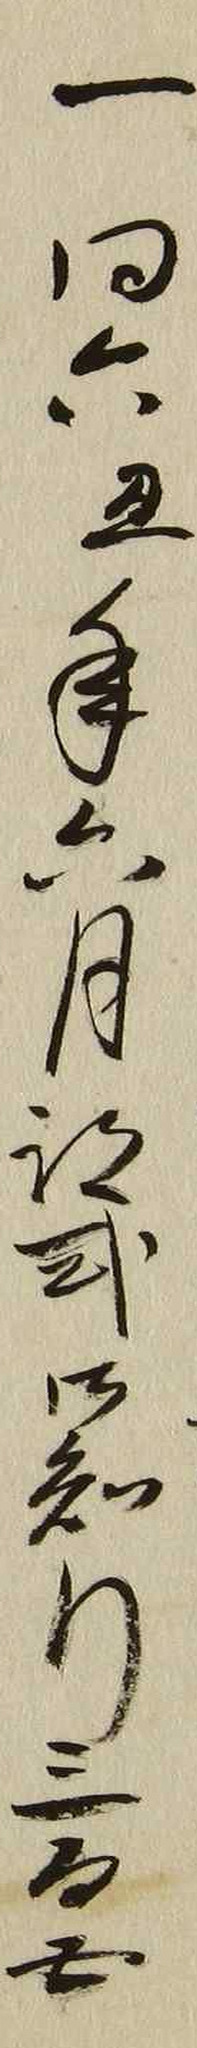一同六丑年六月跡式御知行三百五
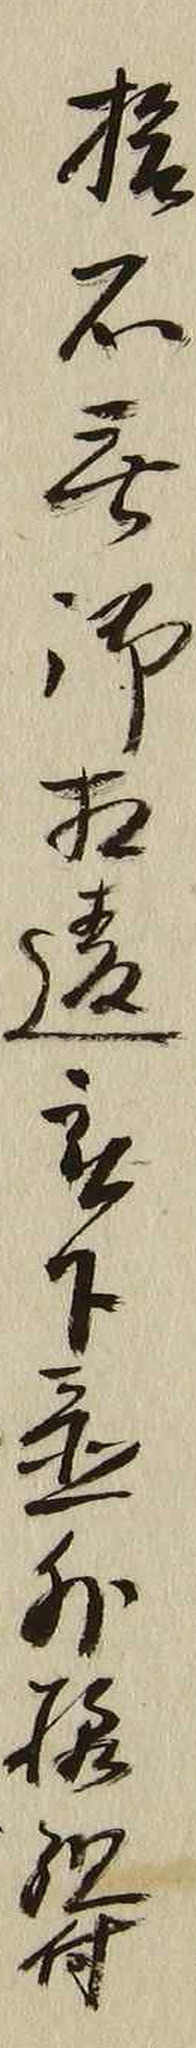拾石無御相違被下置外様組付
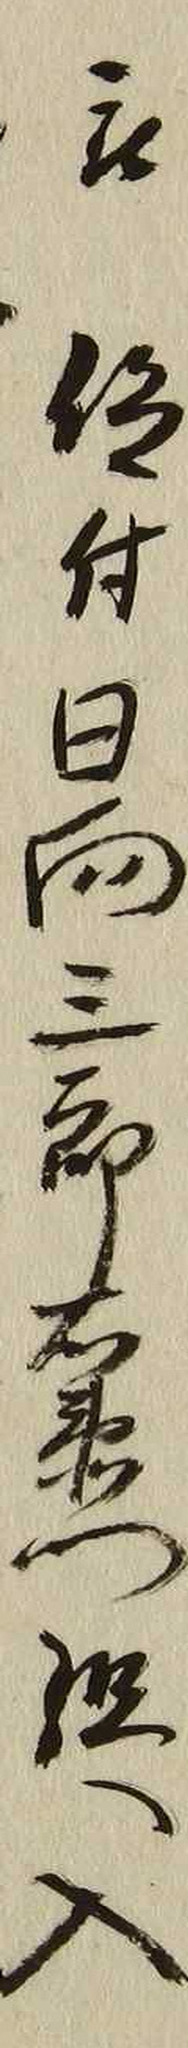被仰付日向三郎右衛門組へ入
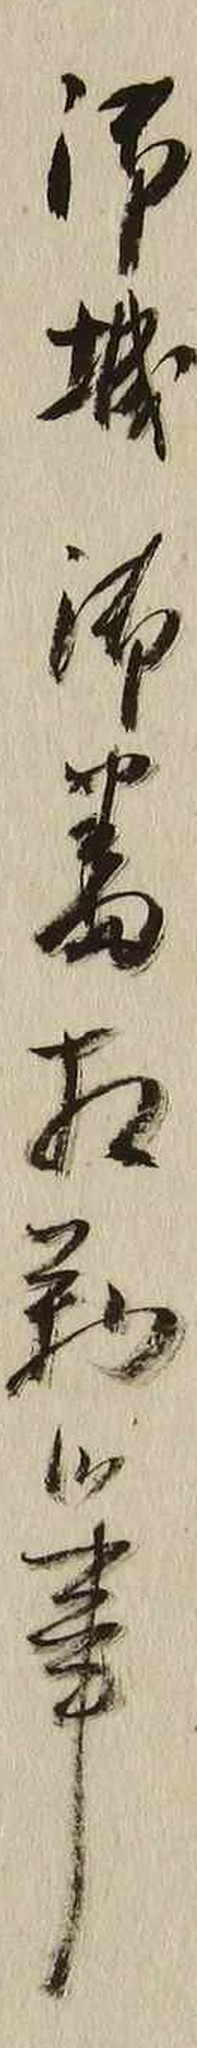御城師番相勤候事
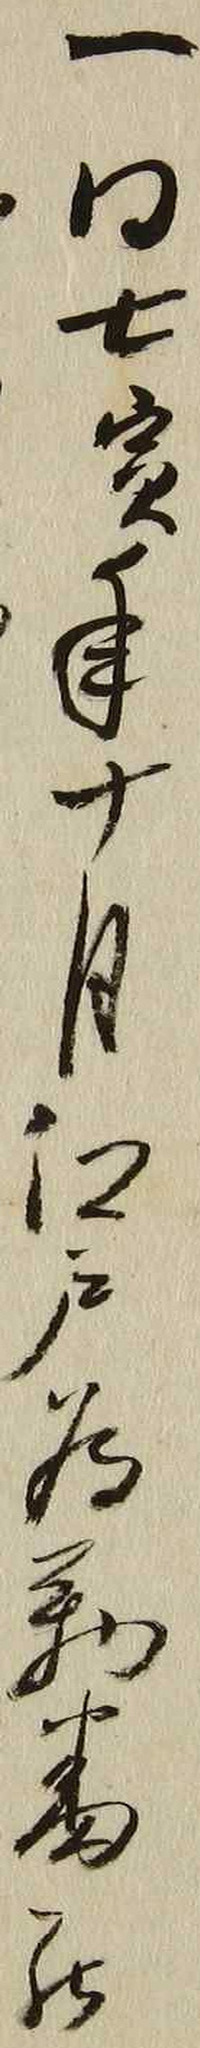一同七寅年十月江戸為勤番罷
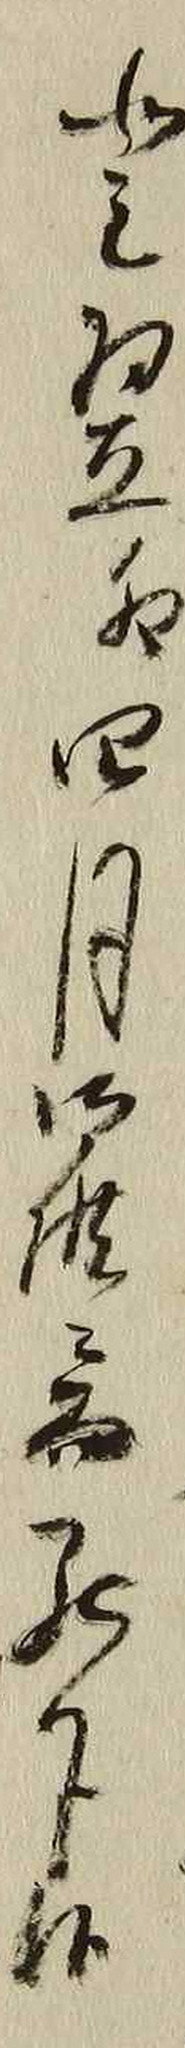登翌卯四月御供ニ而罷下候
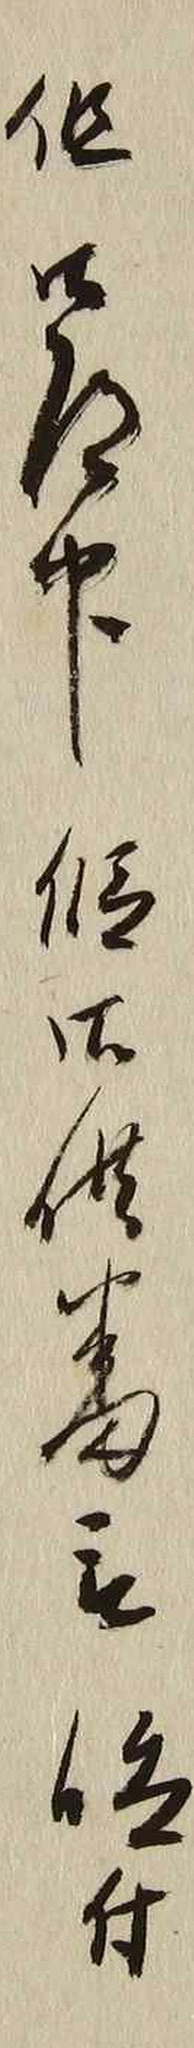但御道中仮御供番被仰付
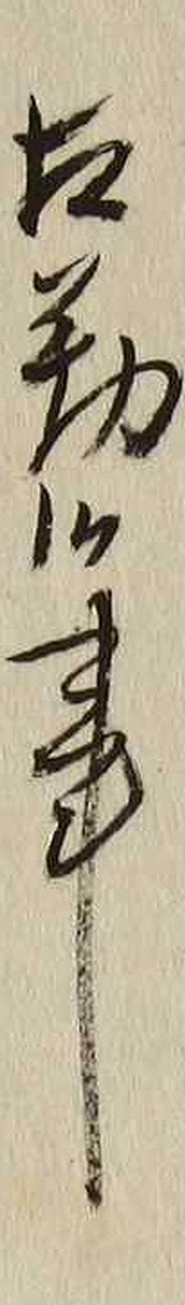相勤候事
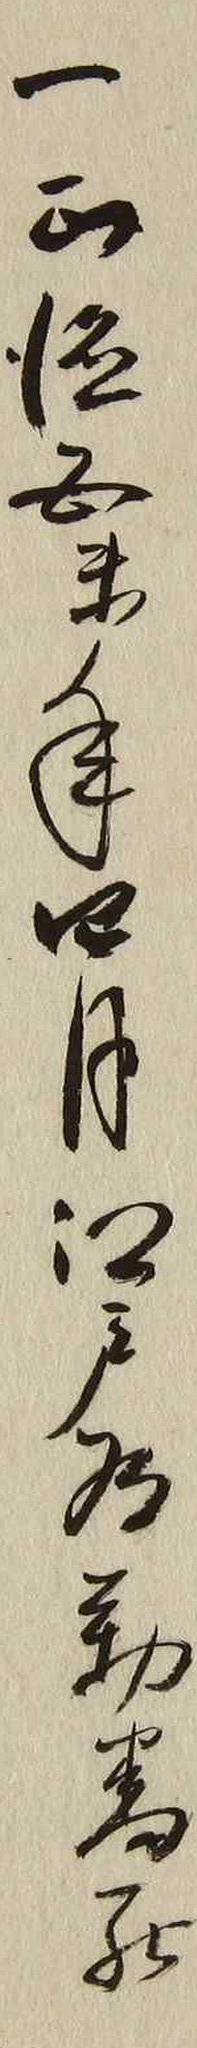一正徳五未年四月江戸為勤番罷
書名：諸士系譜　巻之349　も之部5
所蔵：会津若松市立会津図書館
